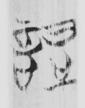{言豆}
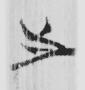之
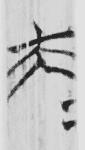夫=
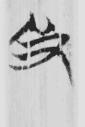及
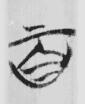百
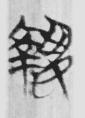執
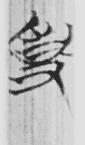事
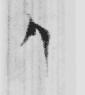人
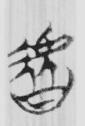{虍皆}
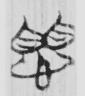{䀠心}
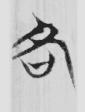各
